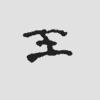壬
